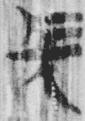長
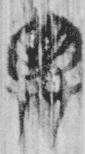與
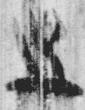之
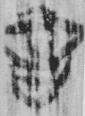言
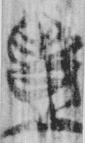豊（禮）
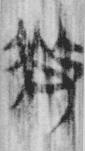敓
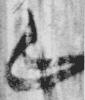㠯（以）
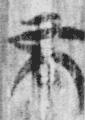不
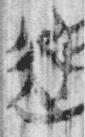逆
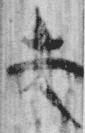○（堯）
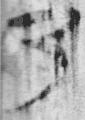乃
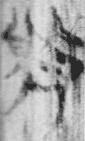敓（悅）
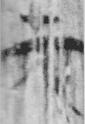○（堯）
